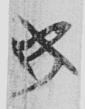𡚦（焉）
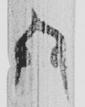夂（終）
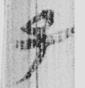子
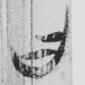曰
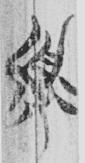○（寡）
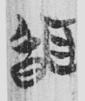○（聞）
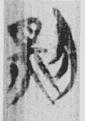則
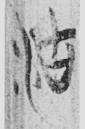沽（孤）
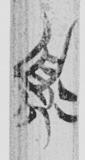○（寡）
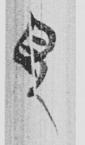見
